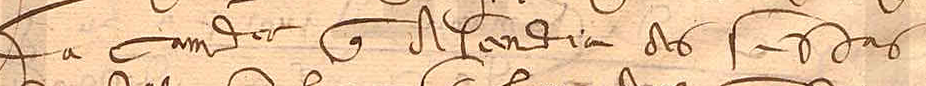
da Camdea q̄ Ascendia As Sestas
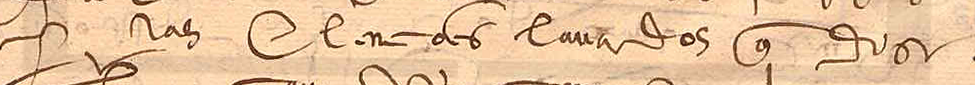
frras e lençoēs lauados q̄ dise
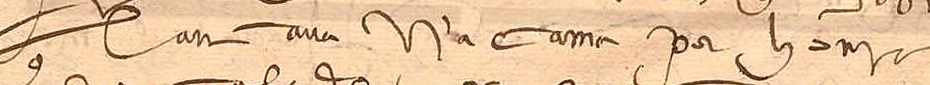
q̄ laucaua Na cama por honra
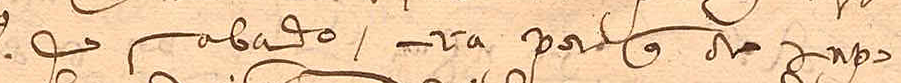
do sabado / era porq̄ Ao tenpo
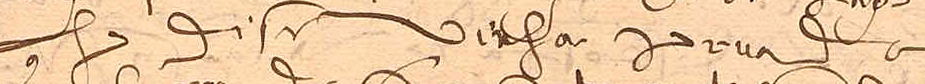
q̅ ho dise vinha toruada
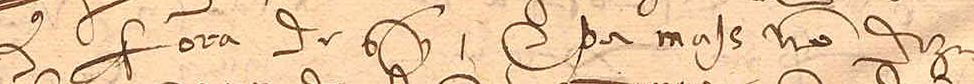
e fora de sy / E por majs nō dize
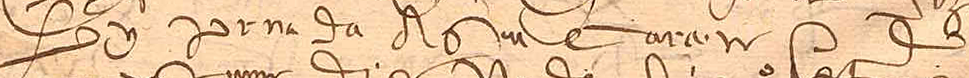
foy tornada A seu carçere E do
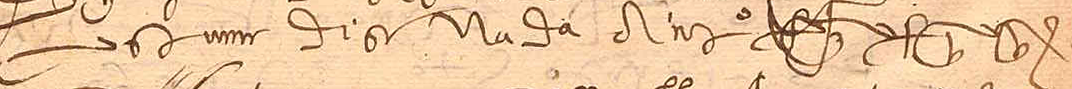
Costume dise Nada Anto Rj̄z o sp̄vy
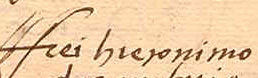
frei hieronimo
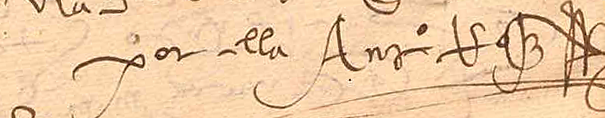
por ella Anto Roj̄z
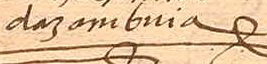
dazambuia
